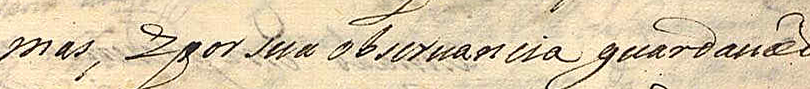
mas, E por sua obseruancia guardauão
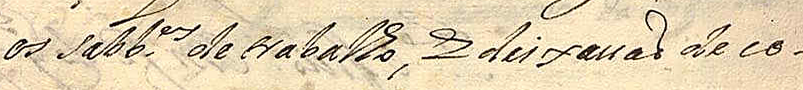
os sabb.os de trabalho, E deixauaõ de co
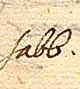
sabb.
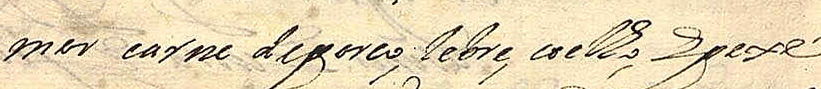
mer carne de porco, lebre, coelho, E pexe
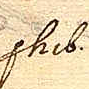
ꝓhib.
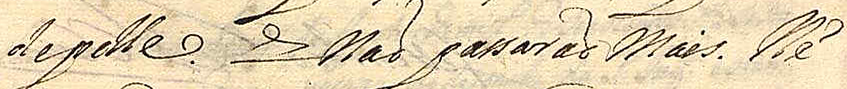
de pelle. E Naõ passarão Mais, Nē
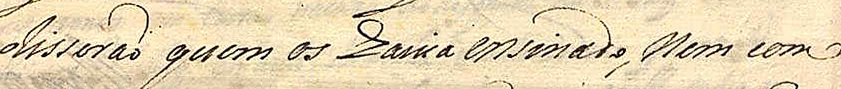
disserão quem os hauia ensinado, nem com
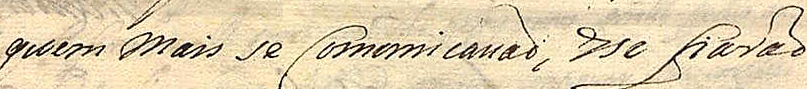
quem mais se Comonicauão, E se fiarão
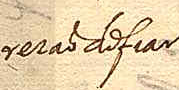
rezaõ do fiar
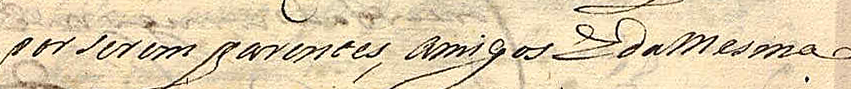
por serem parentes, amigos E da mesma
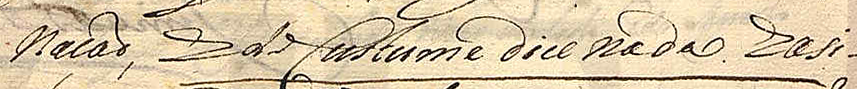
Nação, E do Custume dice nada. E asi
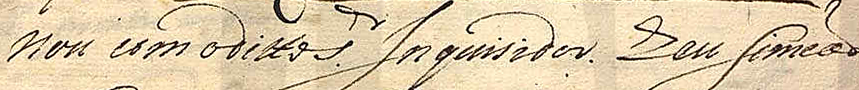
nou com o ditto s.or Jnquisidor. E eu Simeão
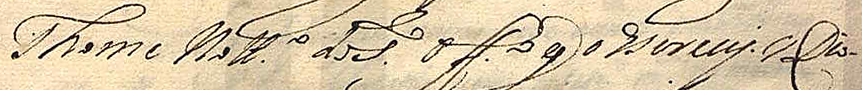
Thome Nott.o do s.to. off.o q̄ o Escreuj. = Dio
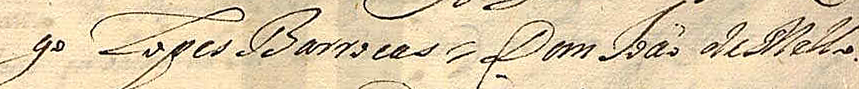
go Lopes Barrocas = Dom Ioão de Mello.
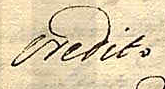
credito
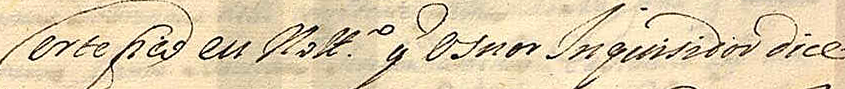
Certefico eu Nott.o q̄ o snor Inquisidor dice
